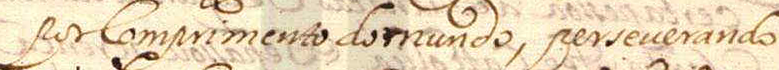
por Comprimento do mundo, perseuerando
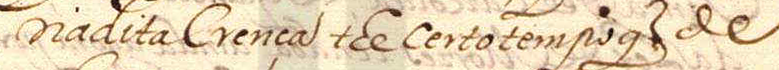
na dita Crença the certo tempo q̄ de
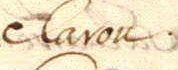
clarou.
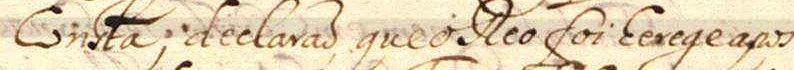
Consta, declaraõ, que o Reo foi herege apos
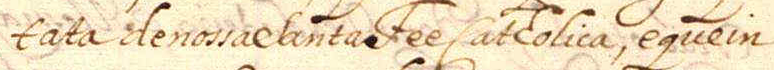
tata de nossa Santa Fee Catholica, e que in
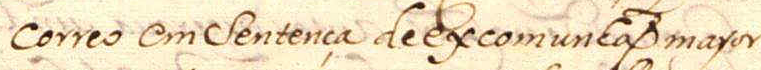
correo em Sentença de excomunhaõ mayor
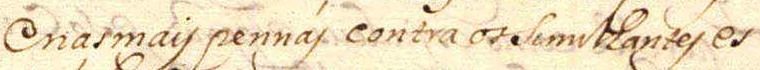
e nas mais pennas contra os similhantes es
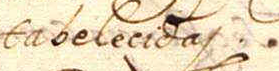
tabelecidas.
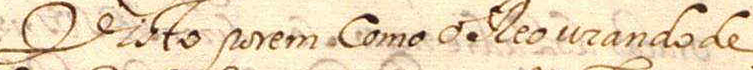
Visto porem Como o Reo uzando de
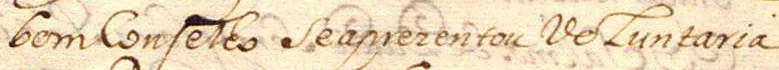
bom Conselho se aprezentou Voluntaria
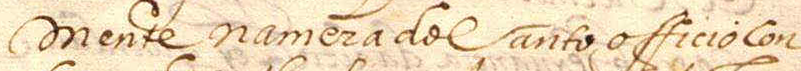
mente na meza do Santo offiçio con
